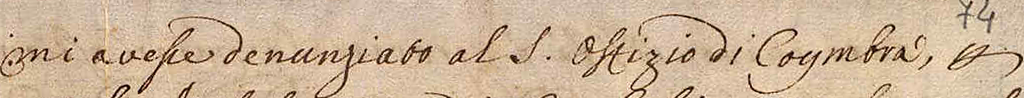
mi avesse denunziato al S. Offizio di Coymbra, ꝑ
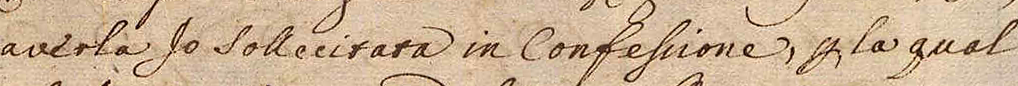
auerla Jo sollecitata in Confessione, ꝑ la qual
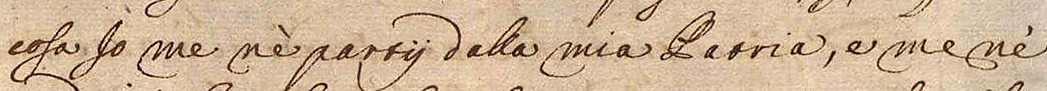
cosa Jo me né partij dalla mia Patria, e me né
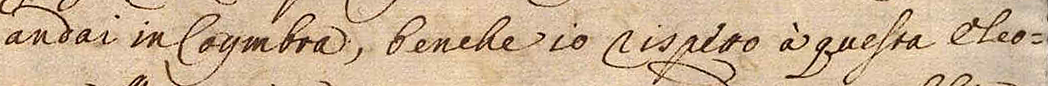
andai in Coymbra, benche io rispetto à questa eLeo
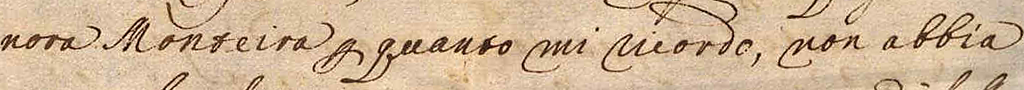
nora Monteira ꝑ quanto mi ricordo, non abbia
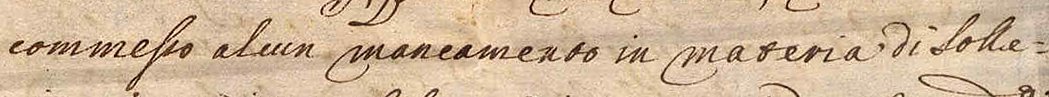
commesso alcun mancamento in materia di solle
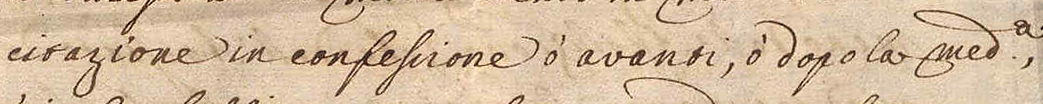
citazione in confessione ó avanti, ó dopo la med.a,
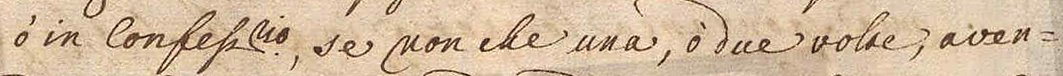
ó in Confessrio., se non che una, ó due volte, aven
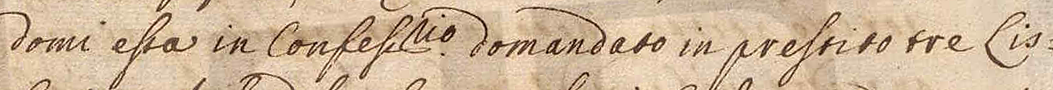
domi essa in Confessrio. domandato in prestito tre Lis
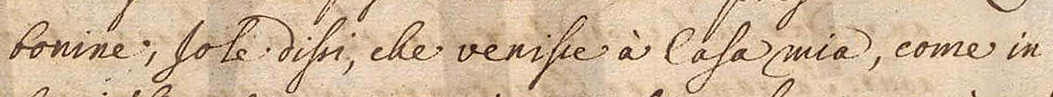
bonine, Jole dissi, che venisse à Casa mia, come in
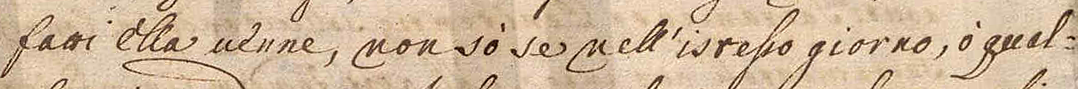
fatti ella uénne, non só se nell'istesso giorno, ó qual
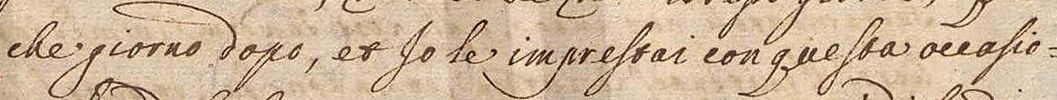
che giorno dopo , et Jo le imprestai con questa occasio
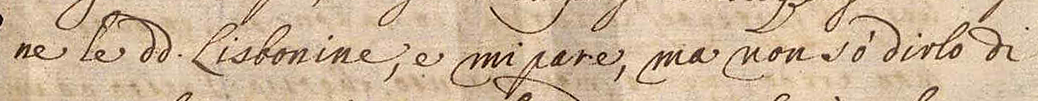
ne le dd. Lisbonine, e mi pare, ma non só dirlo di
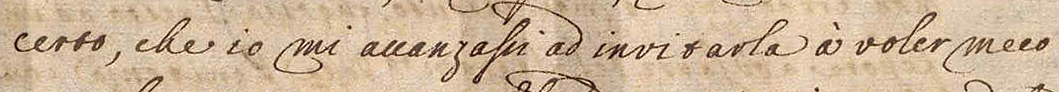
certo, che io mi auanzassi ad invitarla à voler me co
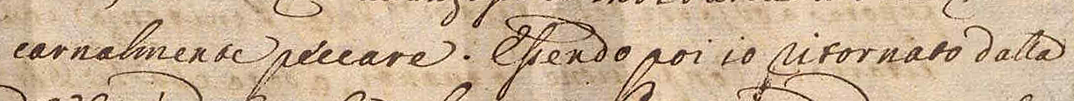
carnalmente péccare. E ssendo poi io ritornato dalla
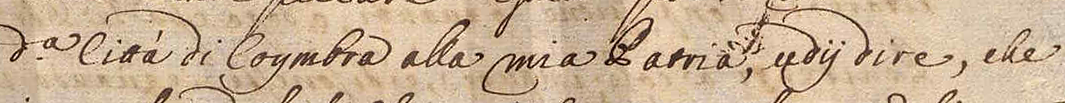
d.a Cittá di Coymbra alla mia Patria, udij dire, che
